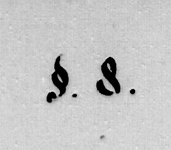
§.8.
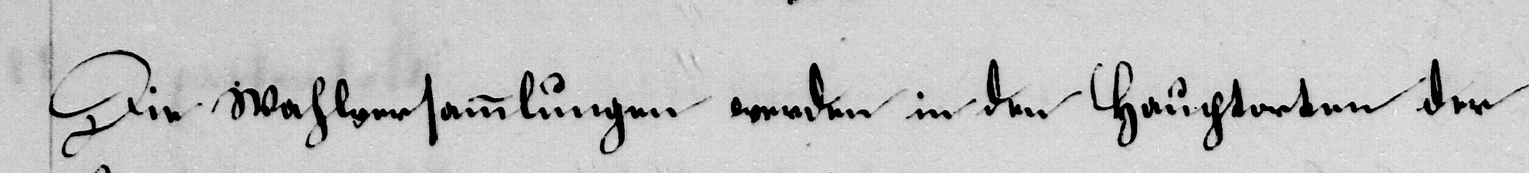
Die Wahlversammlungen werden in den Hauptorten der
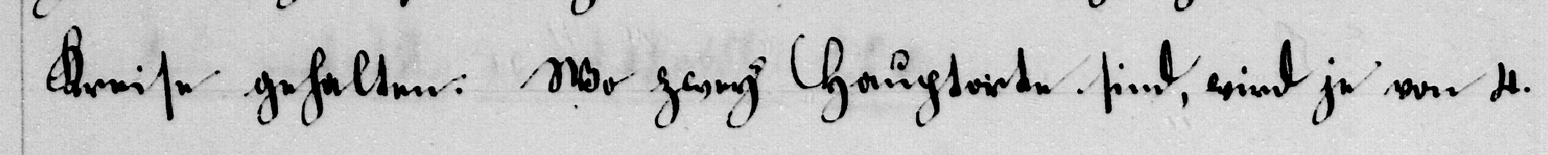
Kreise gehalten. Wo zwey Hauptorte sind, wird je von 4.
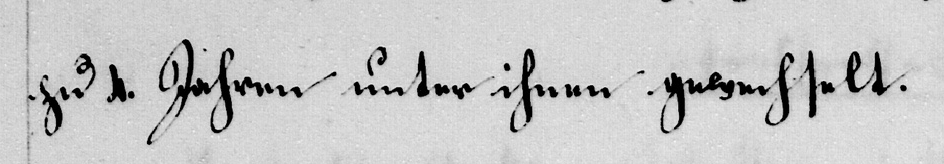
zu 4. Jahren unter ihnen gewechselt.
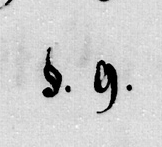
§.9.
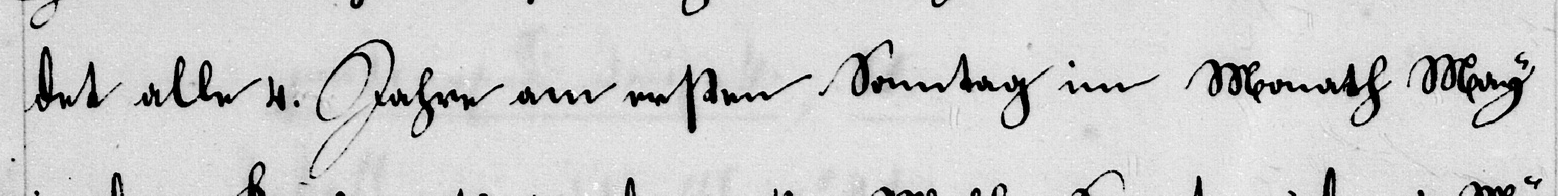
det alle 4. Jahre am ersten Sonntag im Monath März
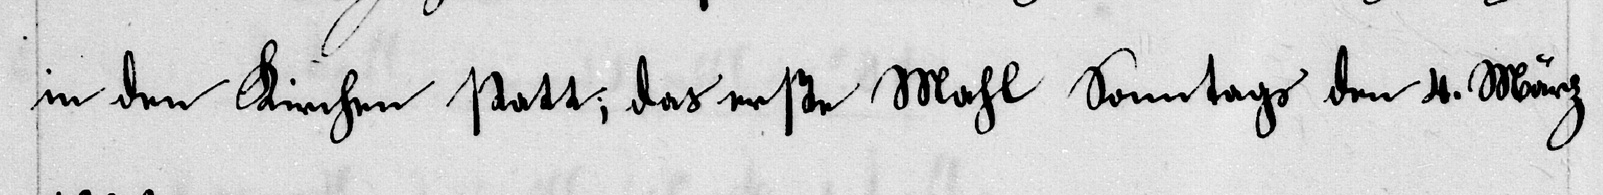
in den Kirchen statt, das erste Mahl Sonntags den 4. März
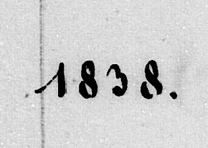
1838.
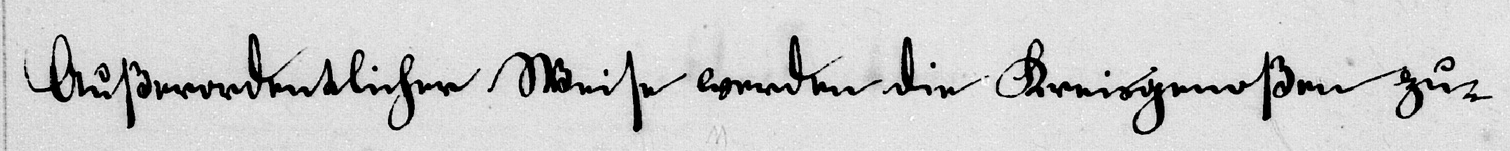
Außerordentlicher Weise werden die Kreisgenoßen zu¬
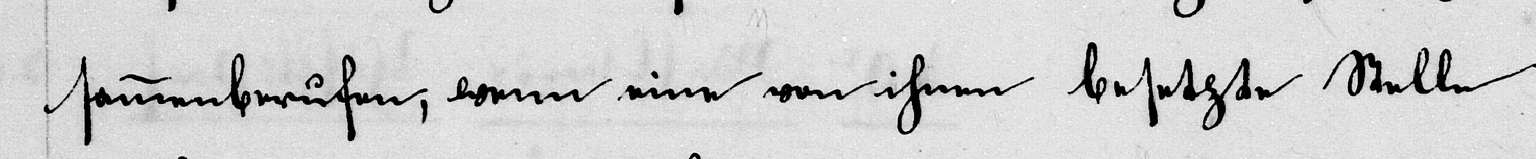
sammenberufen, wenn eine von ihnen besetzte Stelle
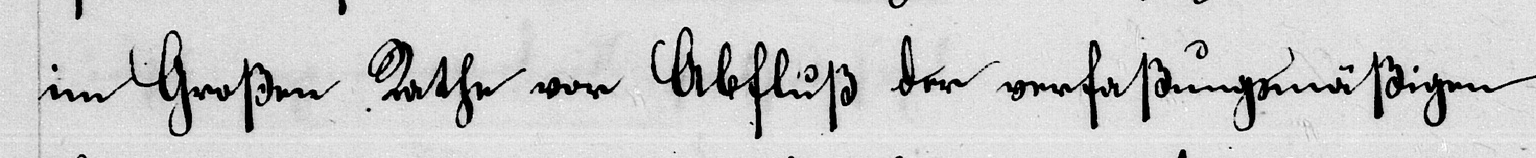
im Großen Rath vor Abfluß der verfaßungsmäßigen
